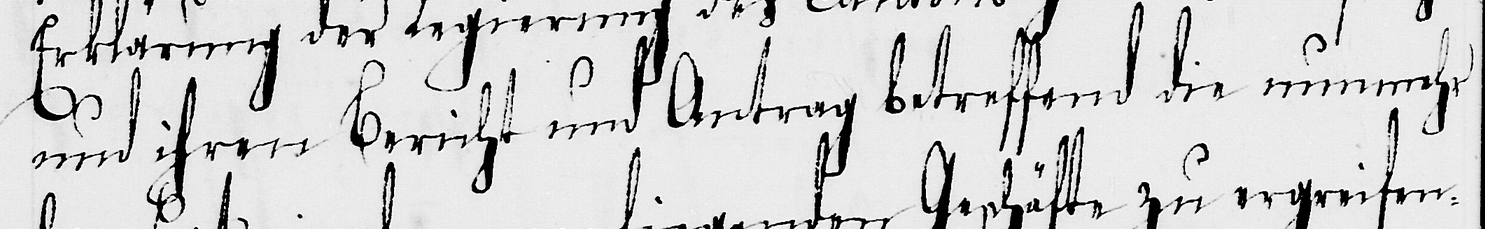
und ihren Bericht und Antrag betreffend die nunmehr
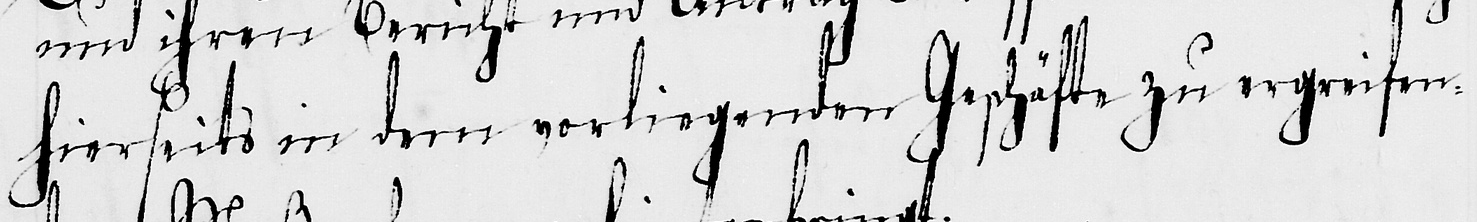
hierseits in dem vorliegenden Geschäfte zu ergreifen¬
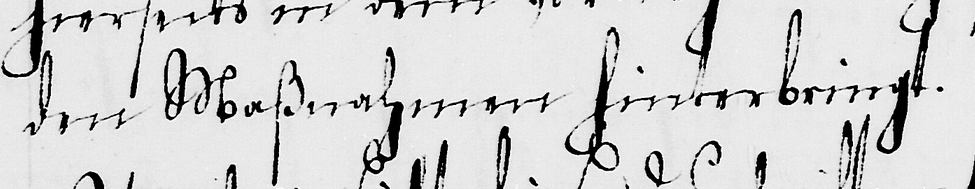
den Maßnahmen hinterbringt.
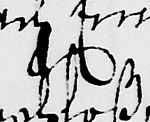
1836.
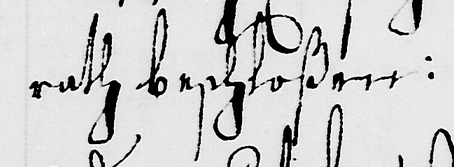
rath beschloßen:
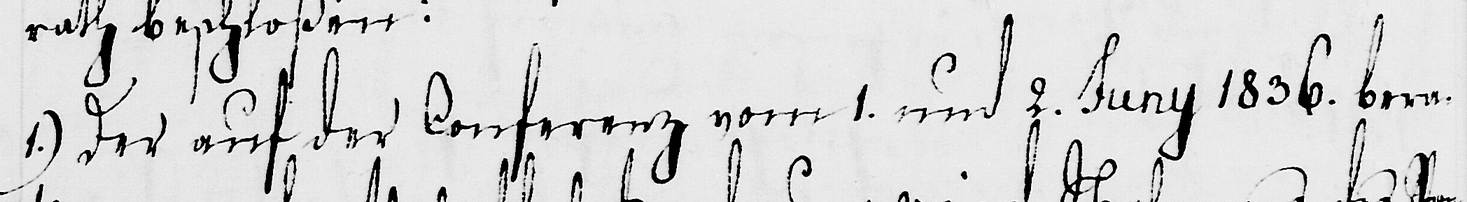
1.) Der auf der Conferenz vom 1. und 2. Juny 1836. bera¬
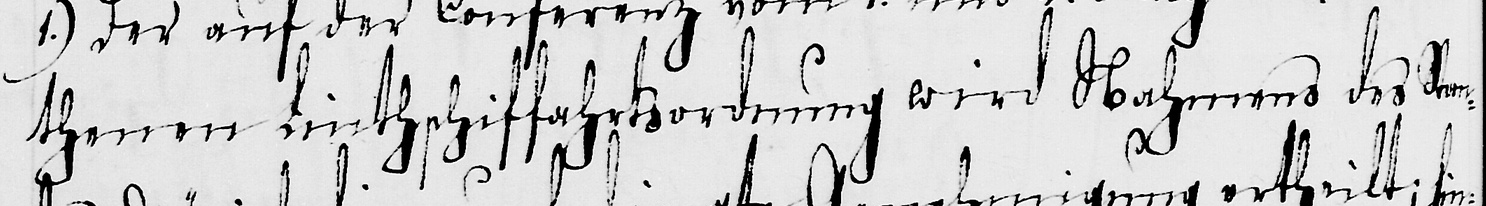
thenen Linthschiffahrtsordnung wird Nahmens des St¬
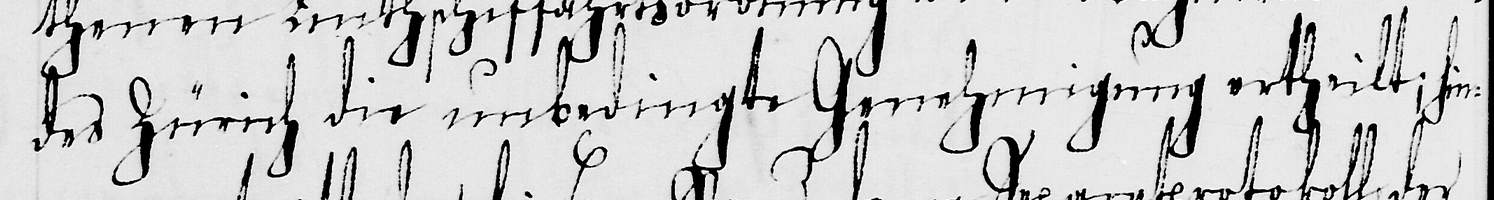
des Zürich die unbedingte Genehmigung ertheilt; h¬
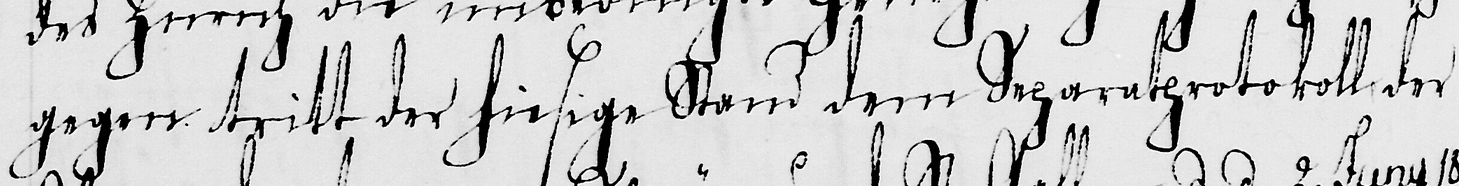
gegen tritt der hiesige Stand dem Separatprotokoll der
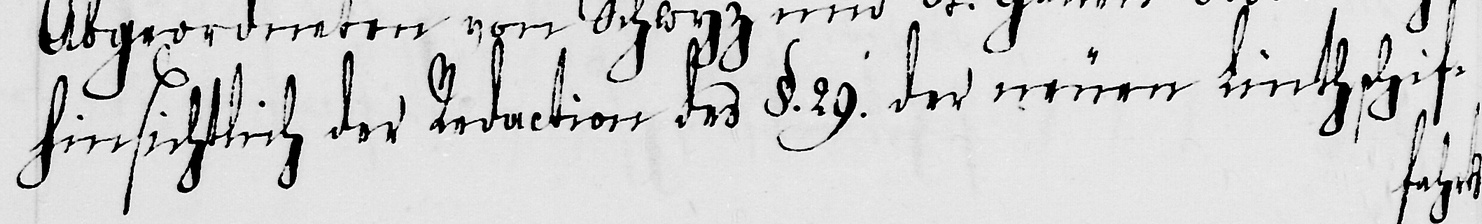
hinsichtlich der Redaction des §. 29. der neuen Linthschif-
